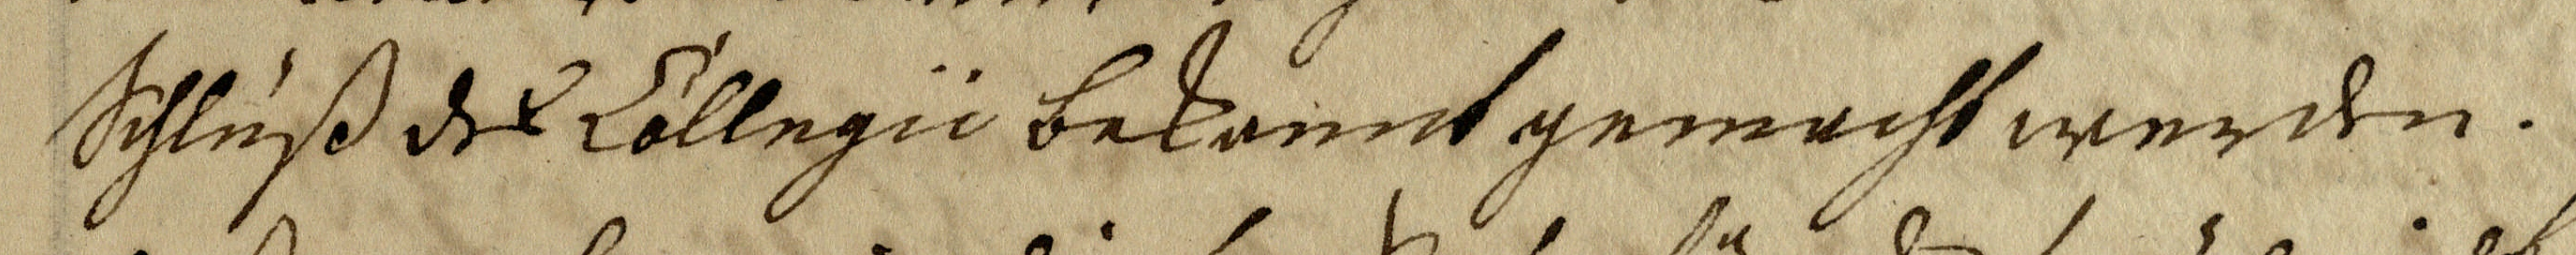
Schluß des Collegii bekannt gemacht werden.
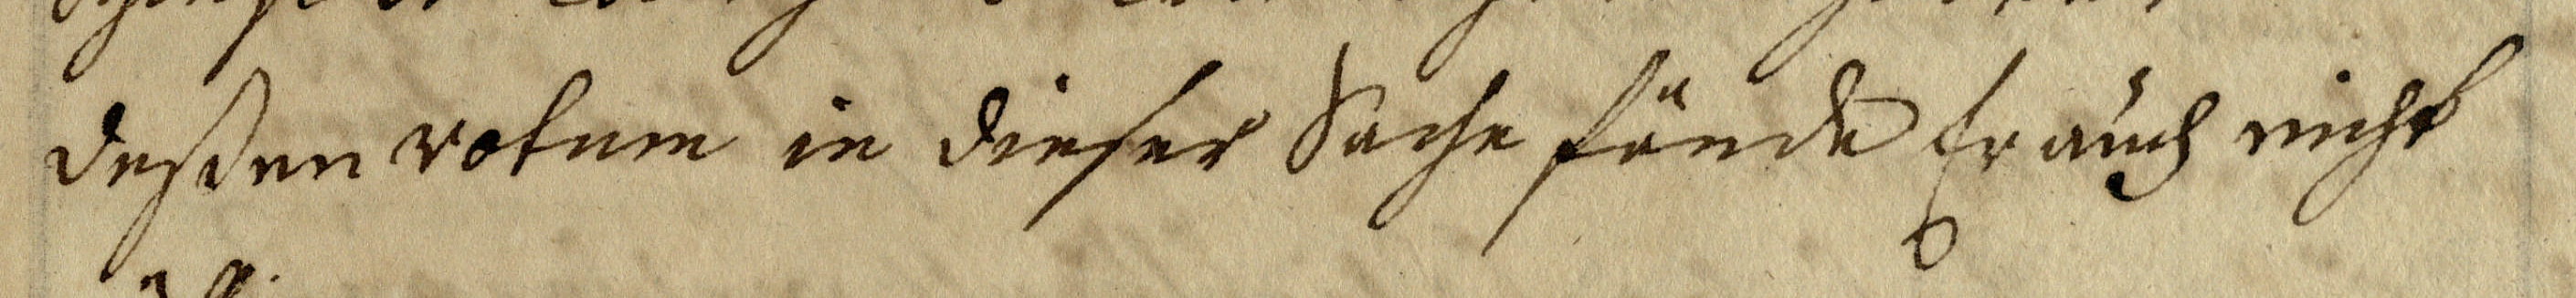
Deßen votum in dieser Sache fände Er auch nicht
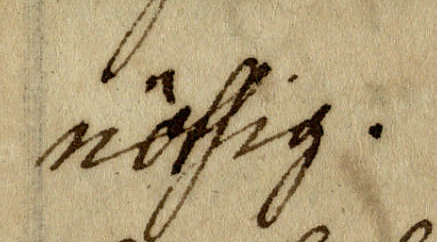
nöthig.
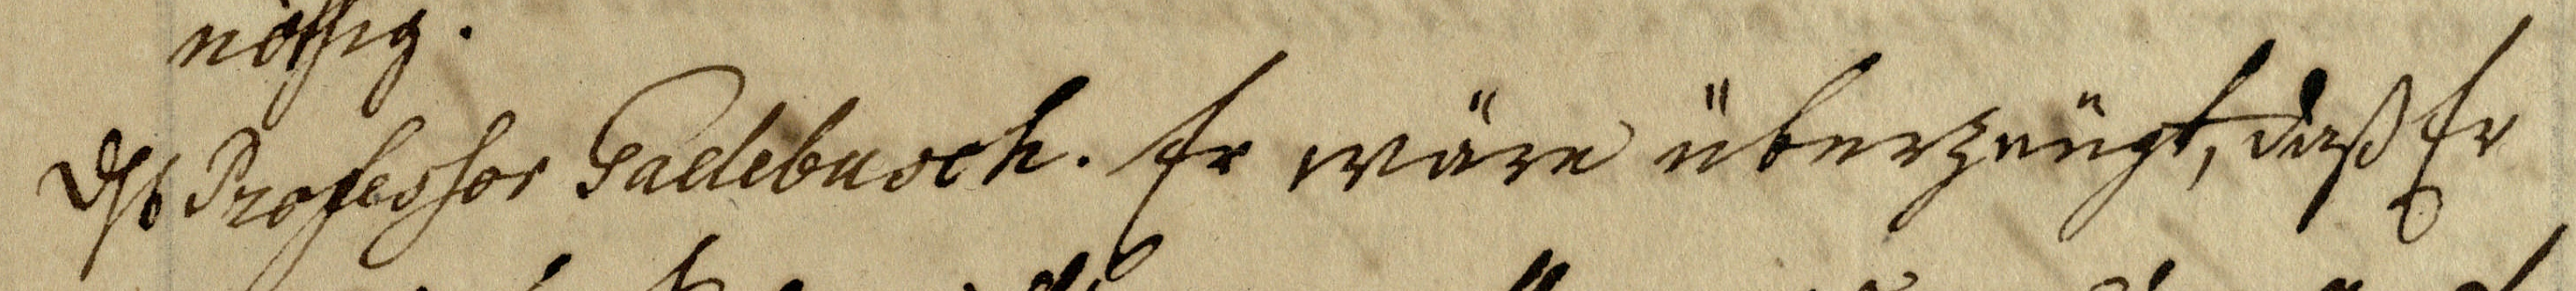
dh Professor Gadebusch. Er wäre überzeugt, daß Er
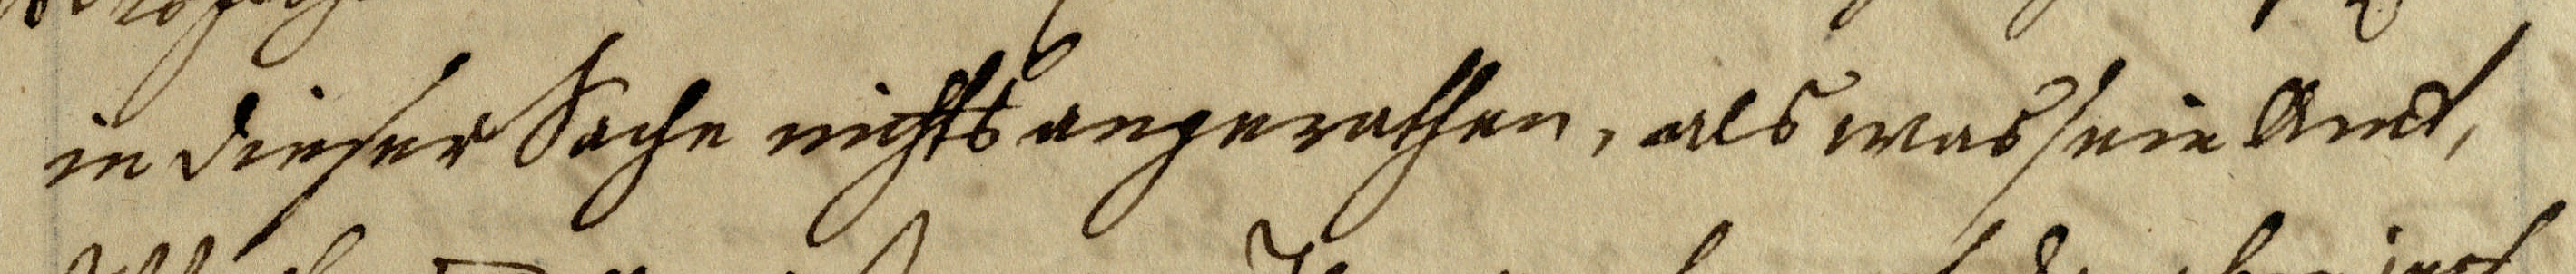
in dieser Sache nichts angerathen, als was sein Amt
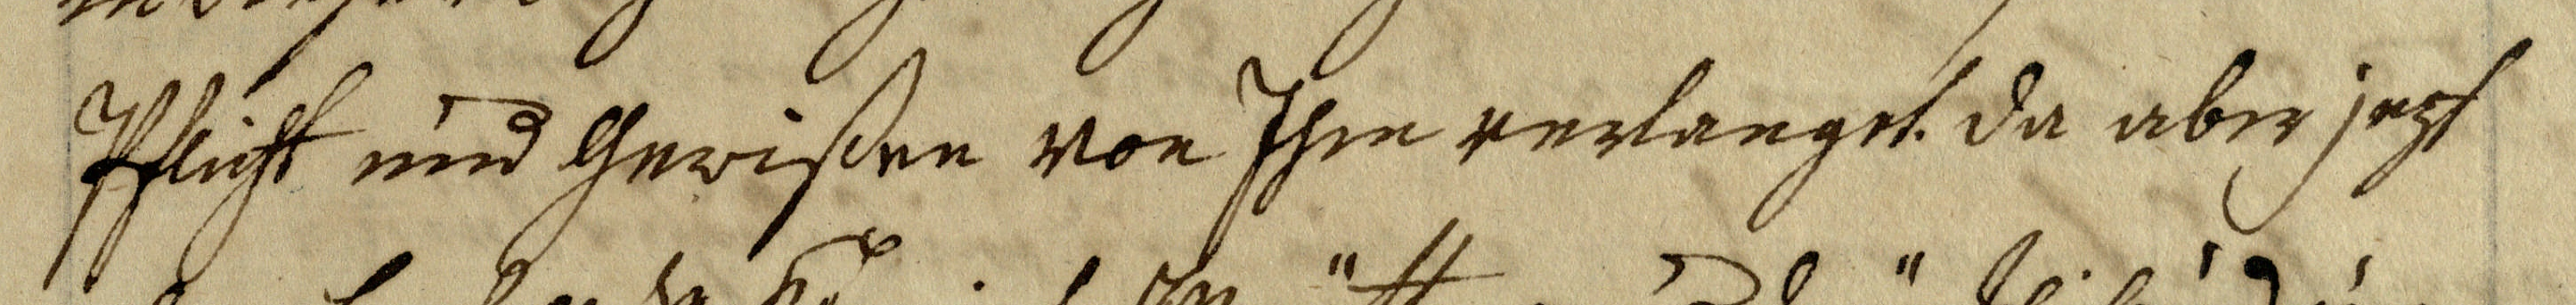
Pflicht und Gewißen von Ihm verlanget da aber jezt
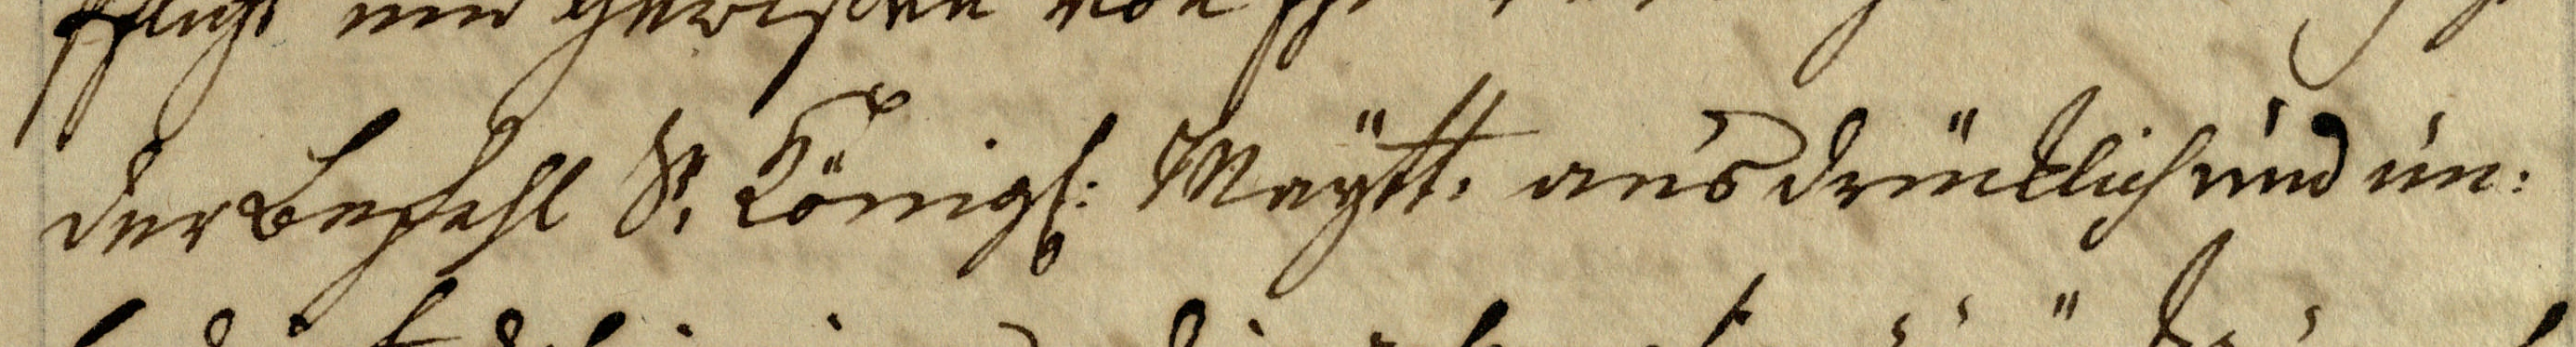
der Befehl Sr. Königl. Maÿtt. ausdrücklich und un¬
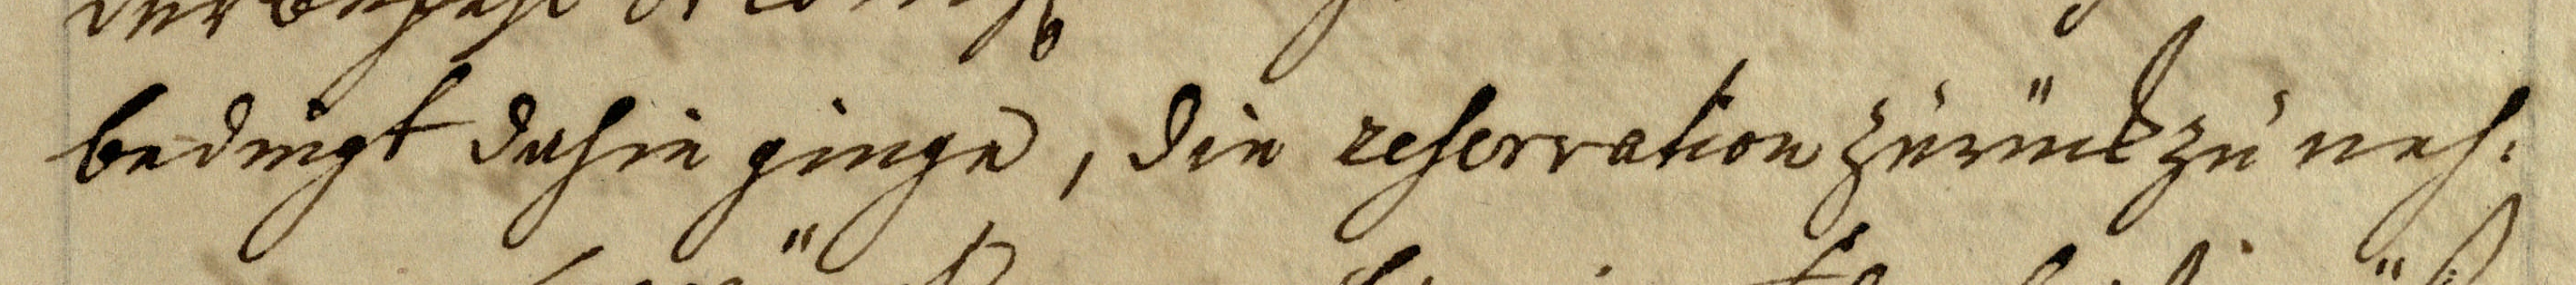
bedingt dahin ginge, die reservation zurück zu neh¬
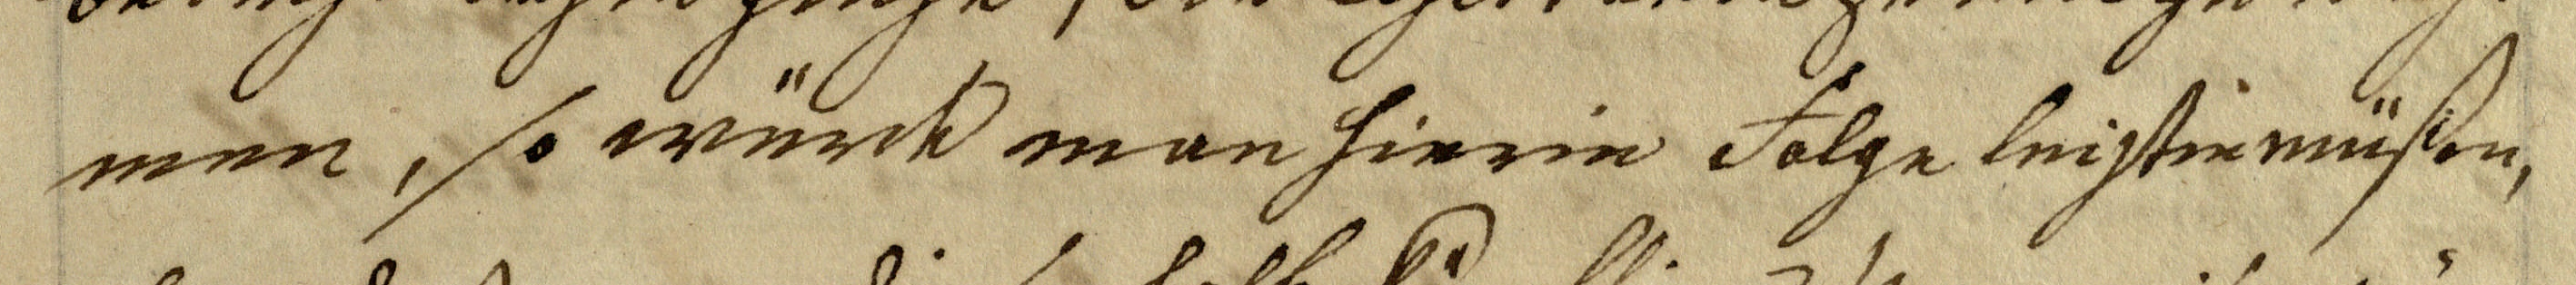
men, so würde man hierin Folge leisten müßen,
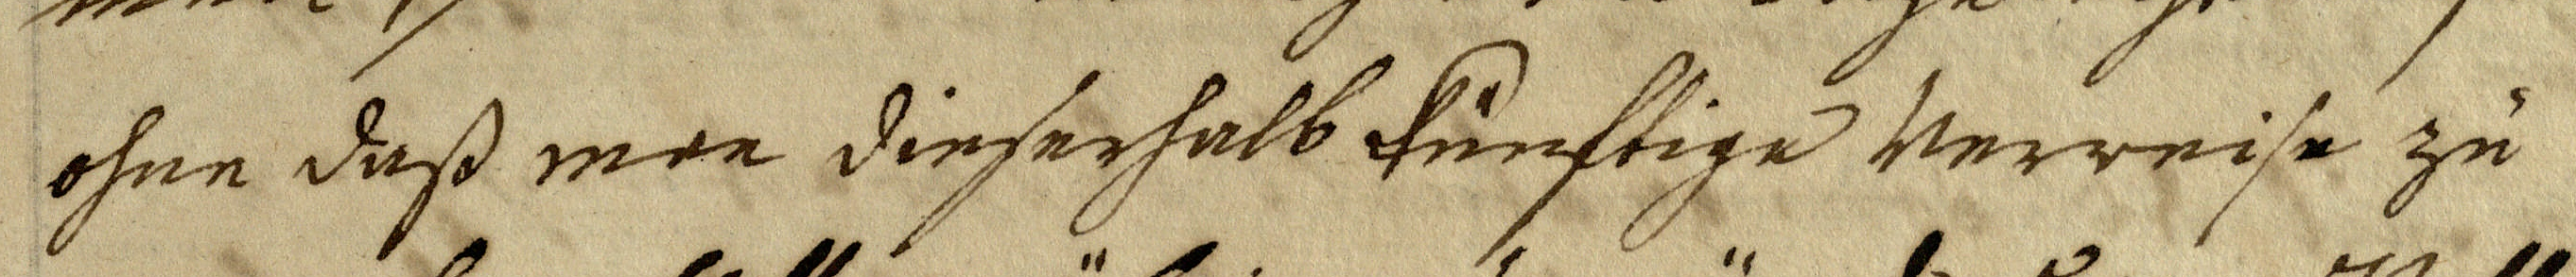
ohne daß man dieserhalb künftige Verweise zu
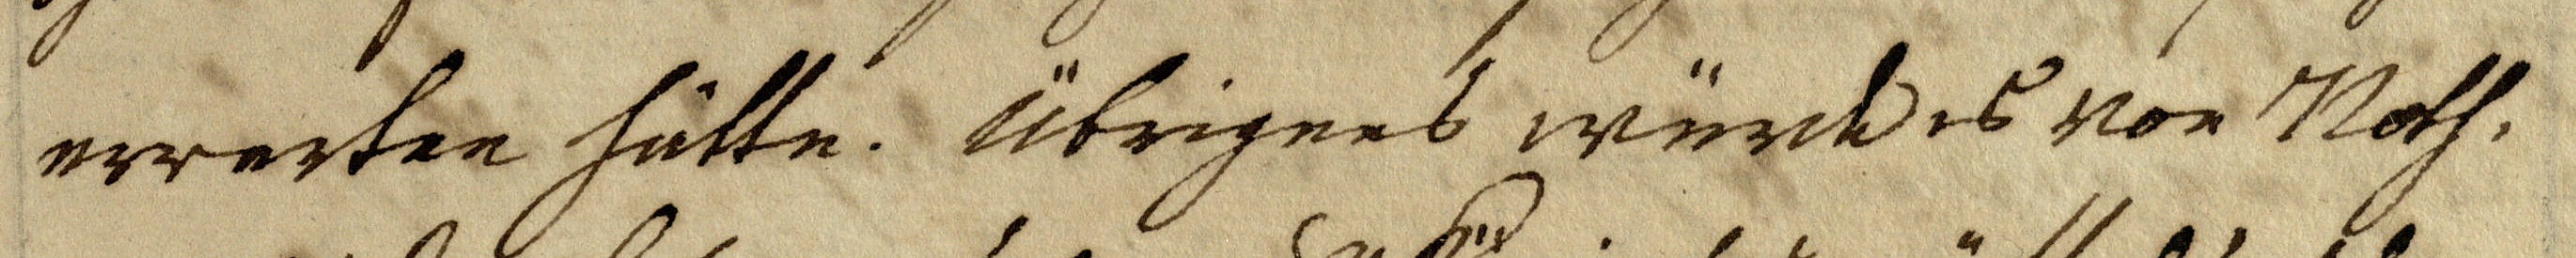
erwarten hätte. Übrigens würde es von Noth¬
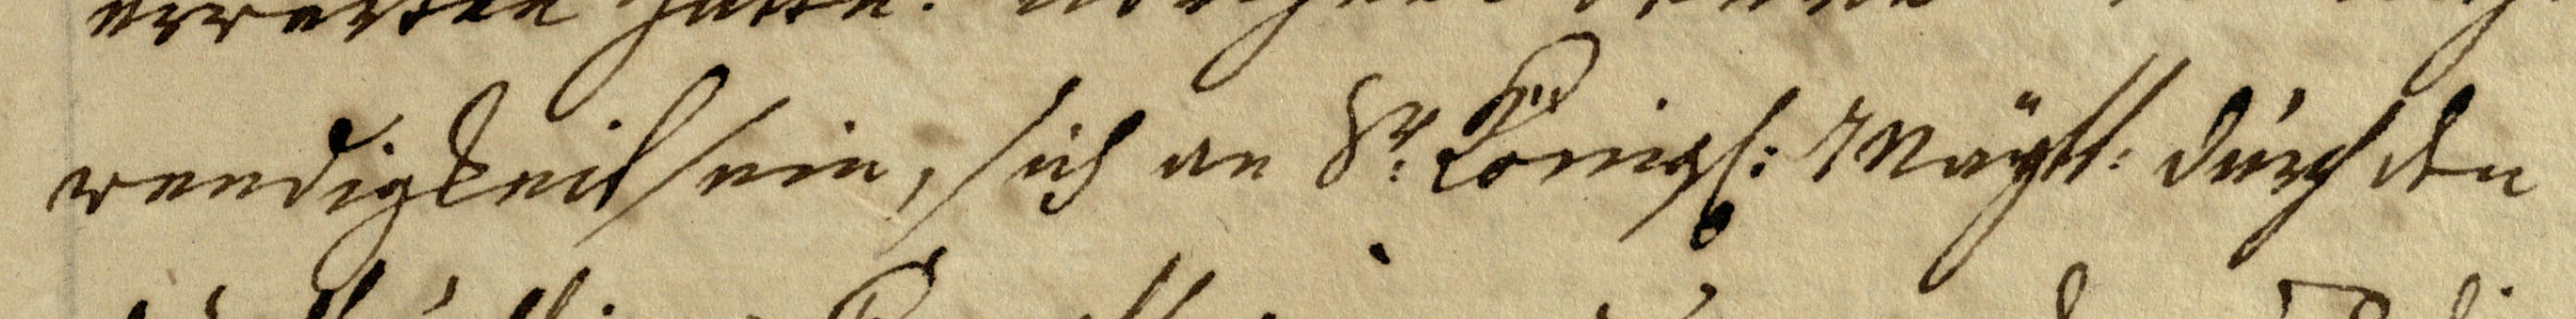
wendigkeit sein, sich an Sr Königl. Maÿtt. durch den
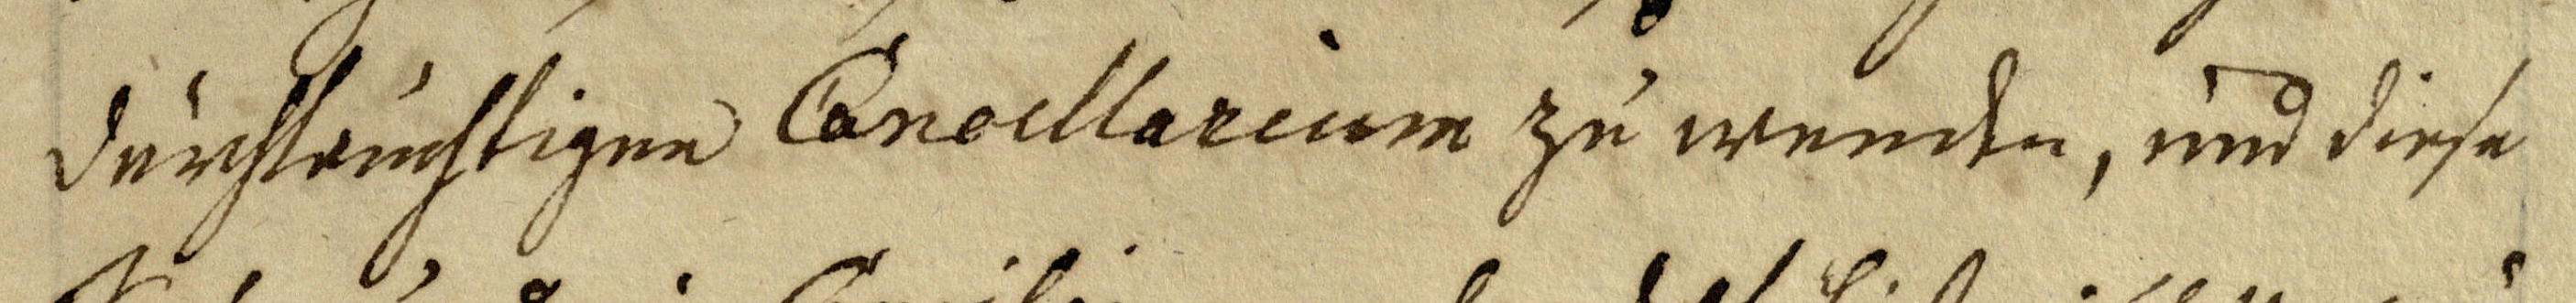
durchlauchtigen Cancellarium zu wenden, und diese
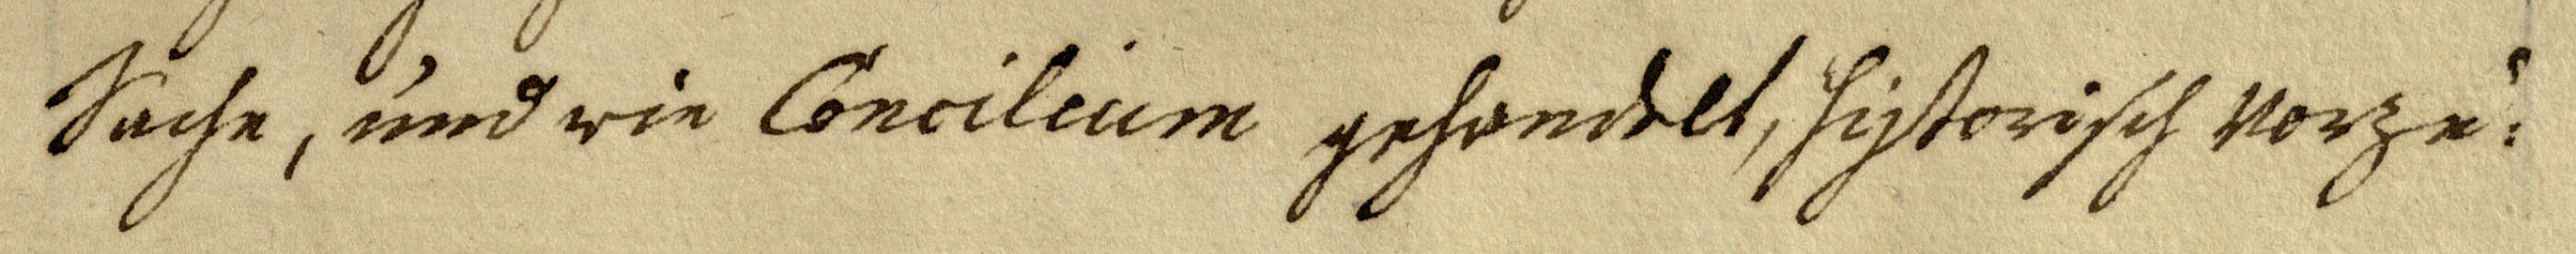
Sache, und wie Concilium gehandelt, historisch vorzu¬
